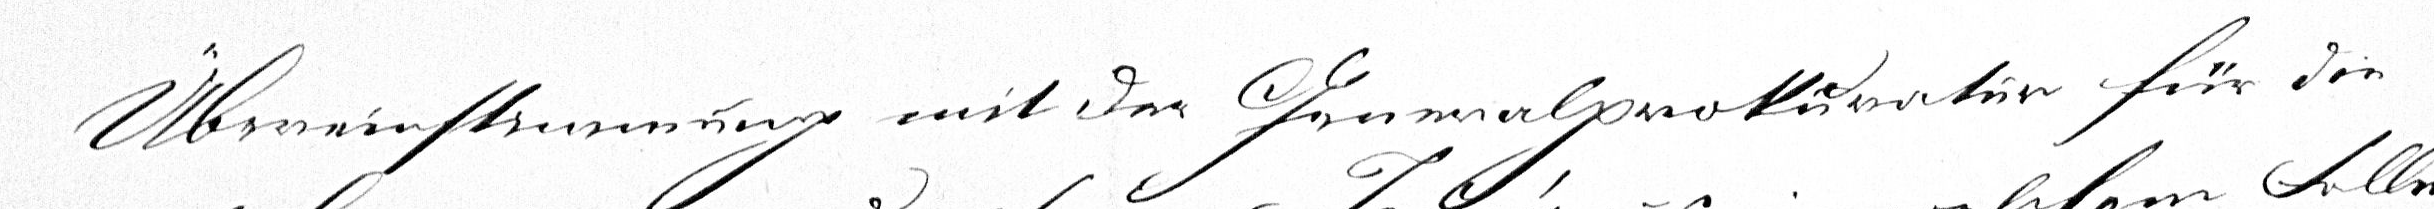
Übereinstramung mit der Genwalprokuratur für die
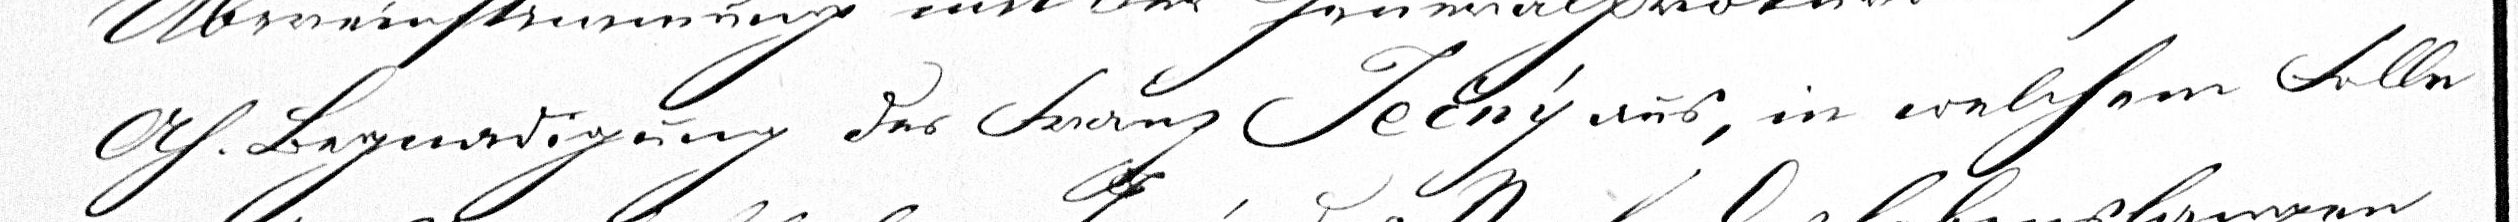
As. Begnadigung des Franz Jecný aus, in welchem Folle
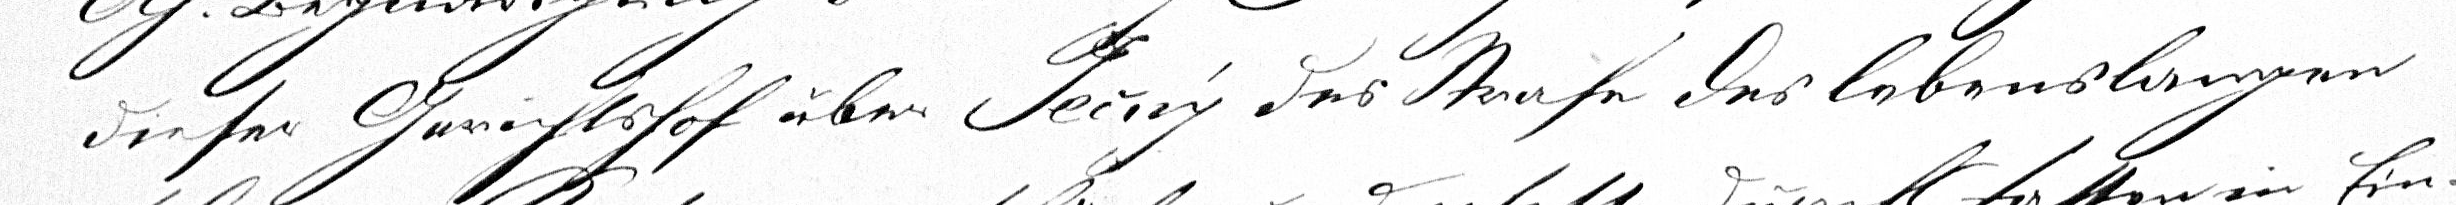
dieser Gerichtshof über Jecný des Strafe des Lebenslagen
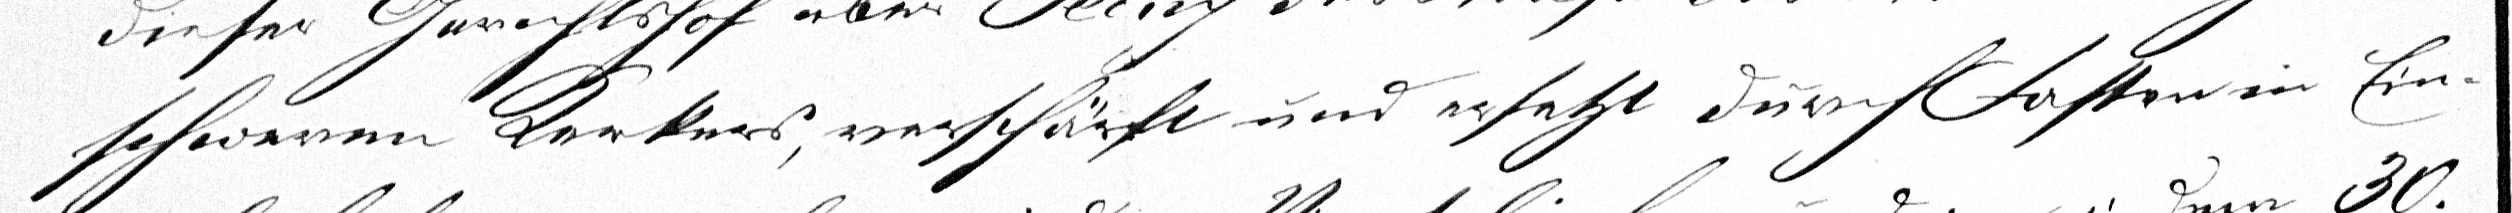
schweren Kerkers, verschärft und ersetzt durch Fasten in Ein¬
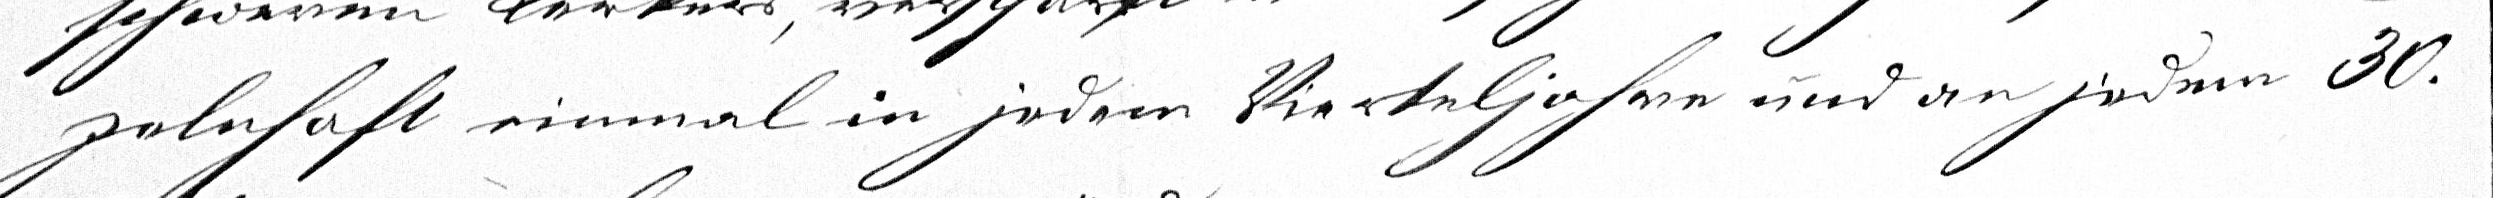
zelnhaft einmal in jedem Vierteljahre und an jedem 30.
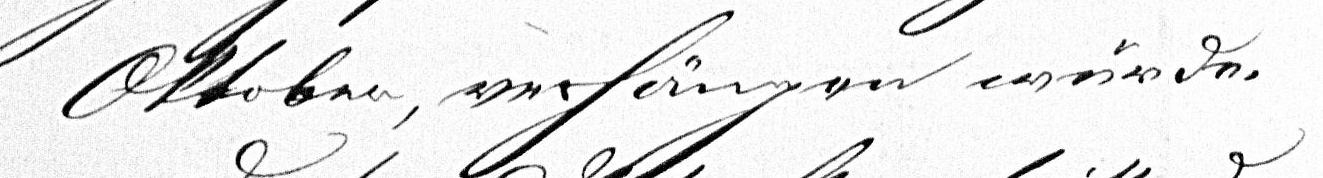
Oktober, verhängen wurde.
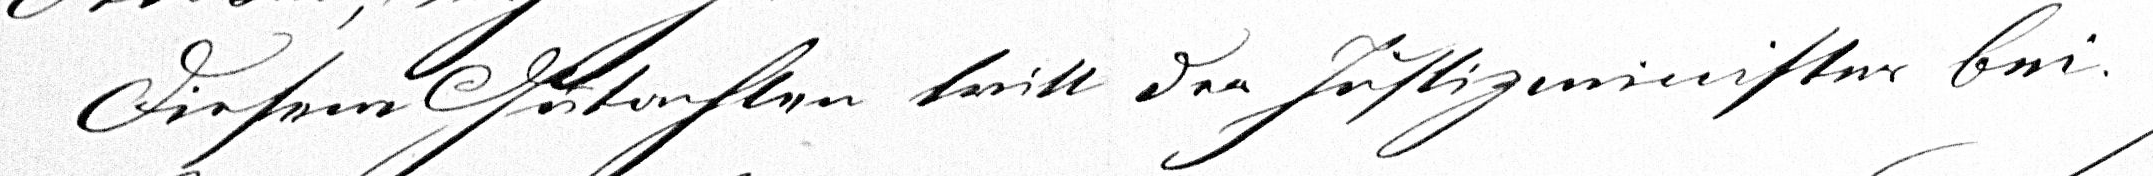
Diesem Gutachten tritt der Justizminister bei.
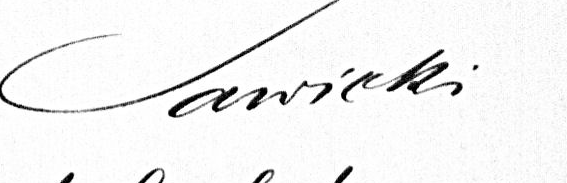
Sawicki
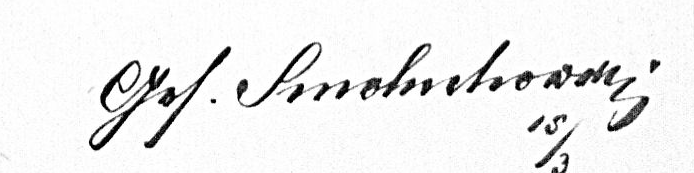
Ges. Smotnetroreni
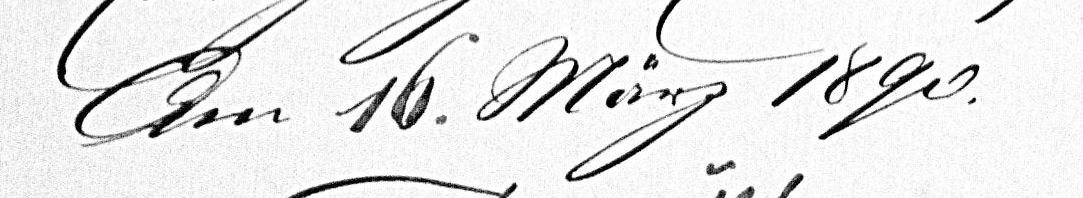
Am 16. März 1890.
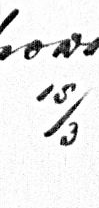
15/3
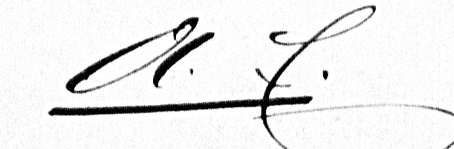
A. E.
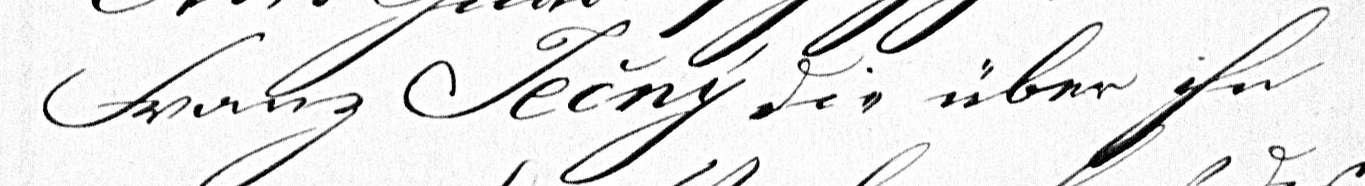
Franz Jecný die über ihn
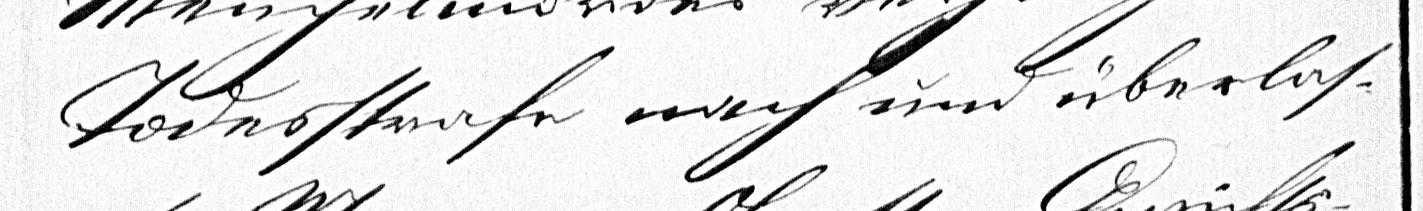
Todesstrafe nach und überlas¬
